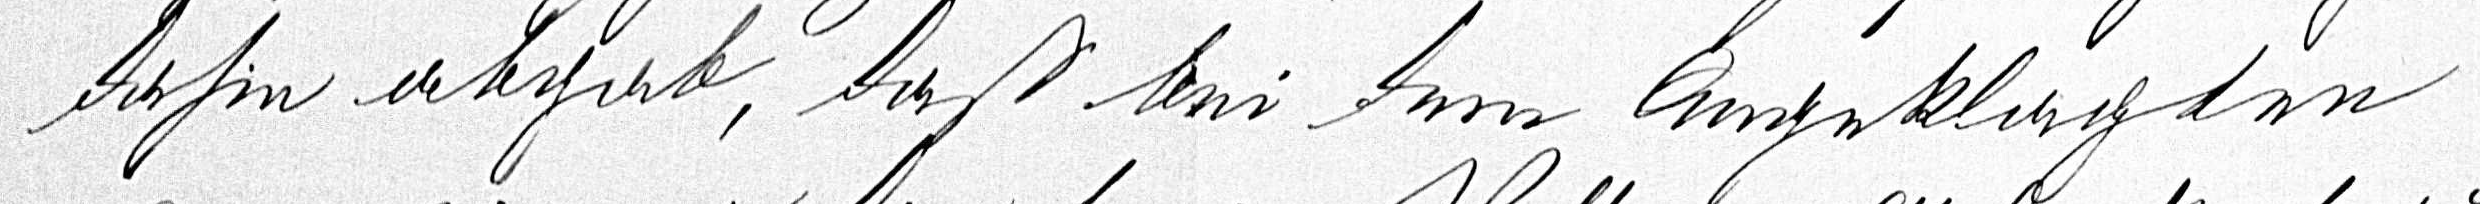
dahin abgab daß bei dem Angeklagten
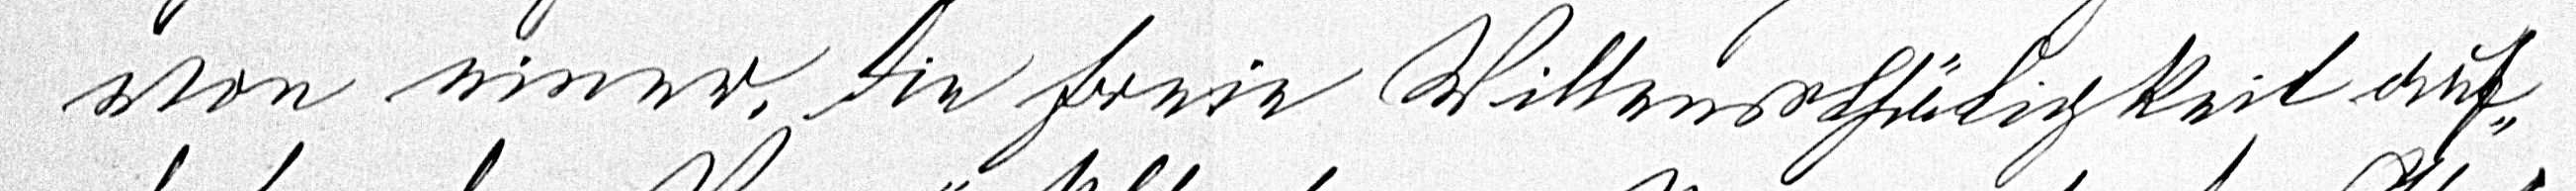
von einer die freie Willensthätigkeit auf¬
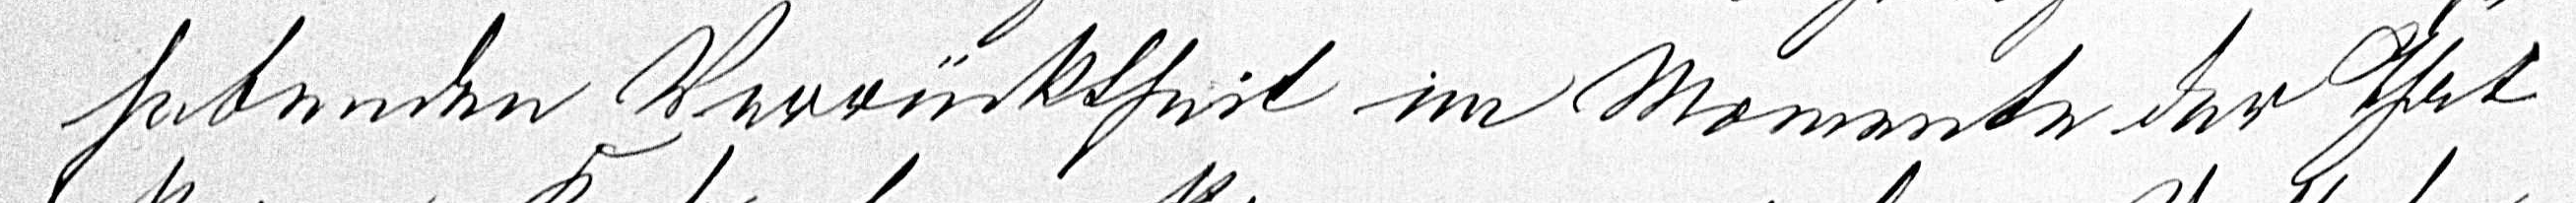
hebenden Verrücktheit im Momente der That
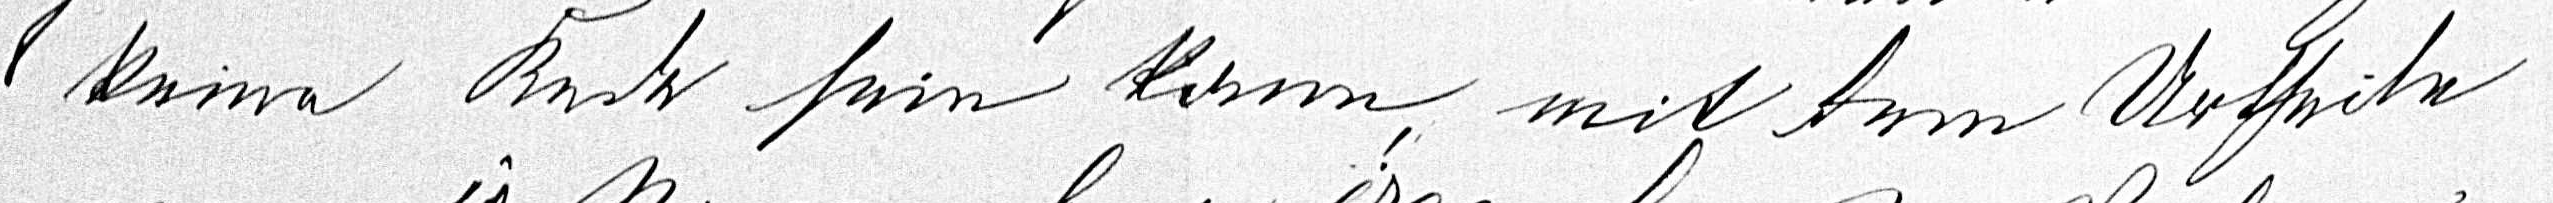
keine Rede sein kann mit dem Urtheile
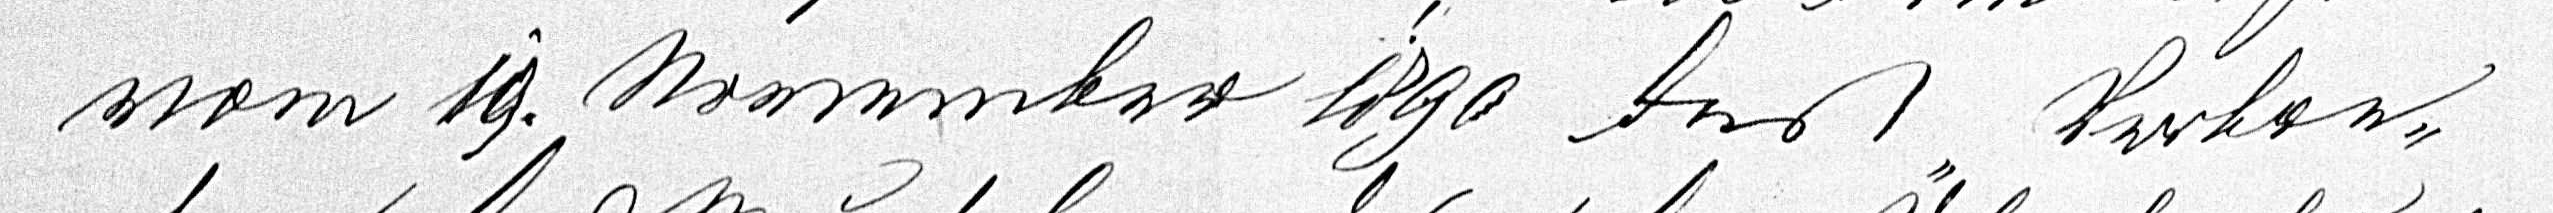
vom 19. November 1890 des Verbre¬
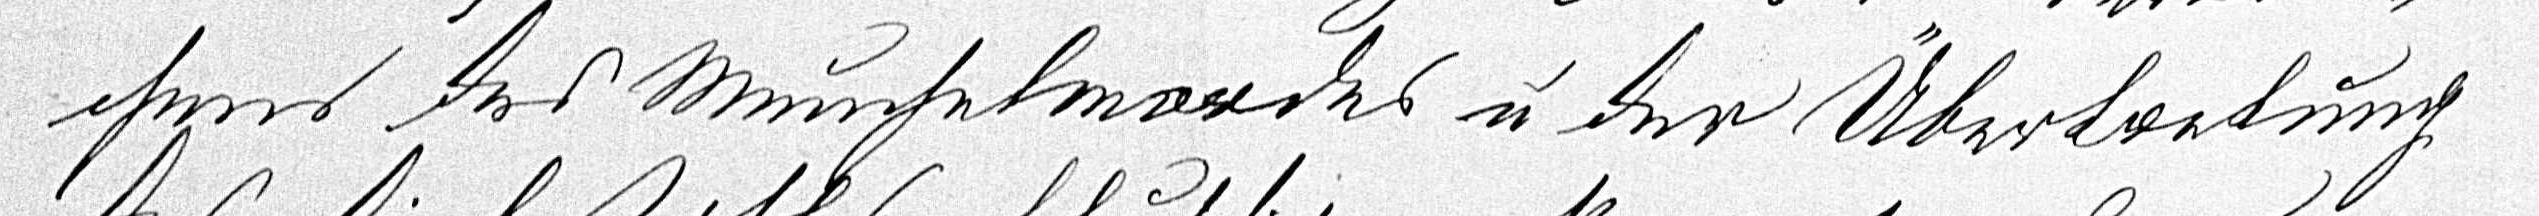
chens des Meuchelmordes u. der Übertretung
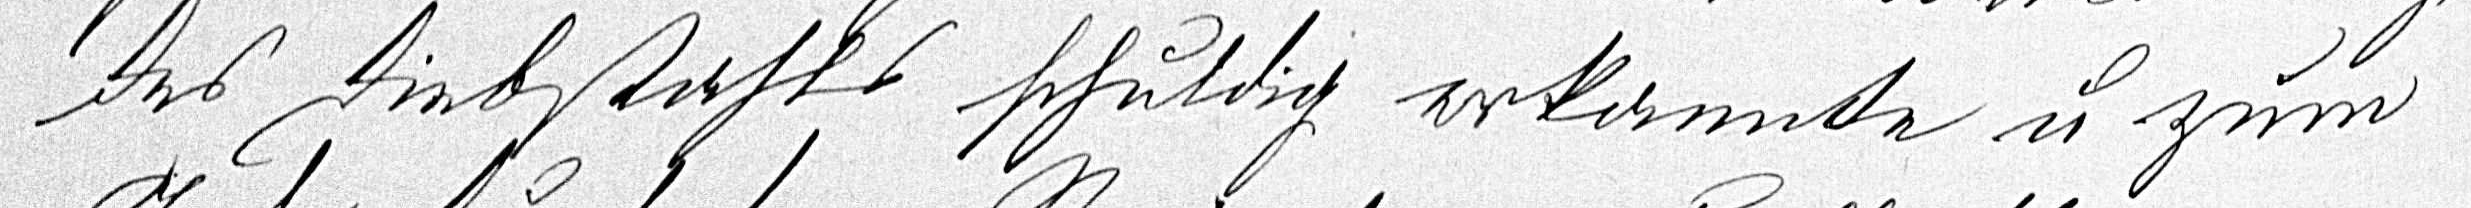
des Diebstahles schuldig erkannte u. zum
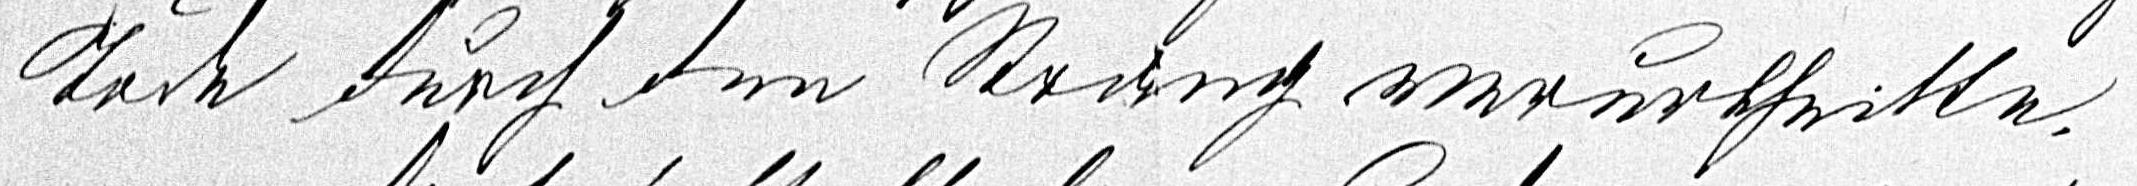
Tode durch den Strang verurtheilte.
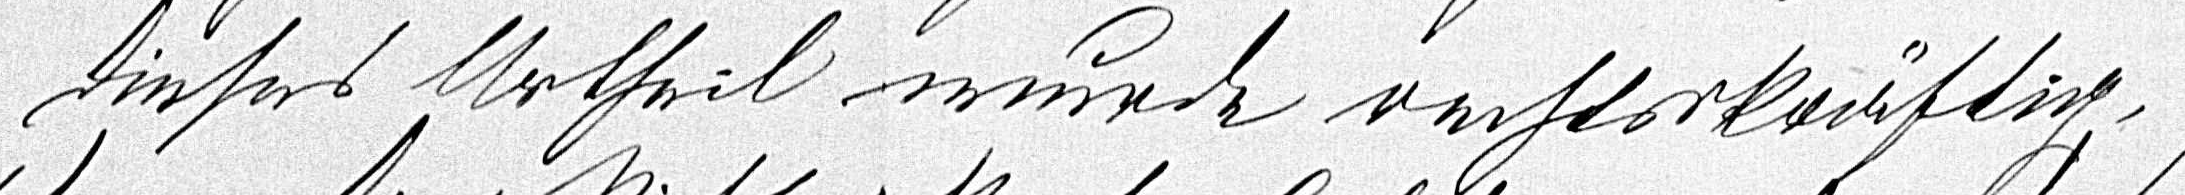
Dieses Urtheil wurde rechtskräftig
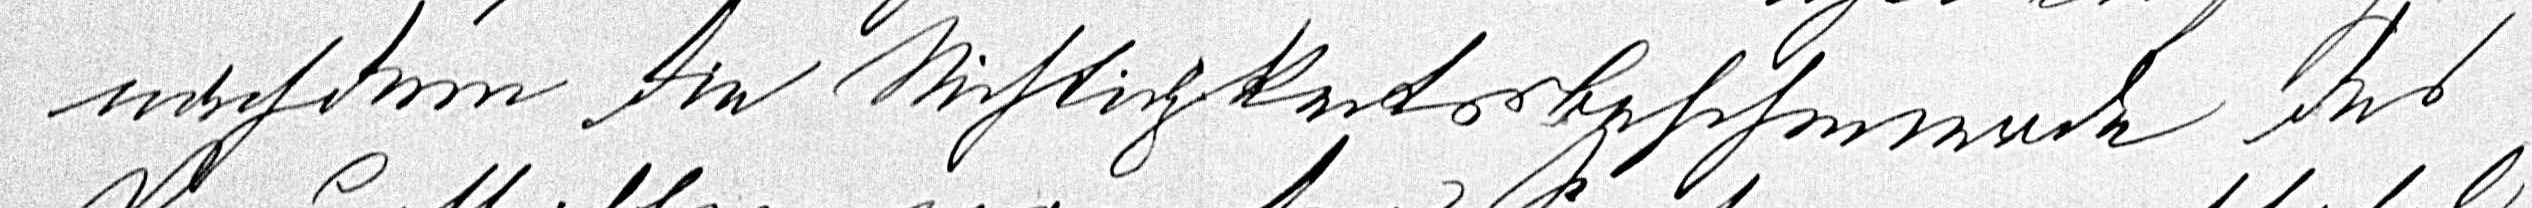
nachdem die Nichtigkeitsbeschwerde des
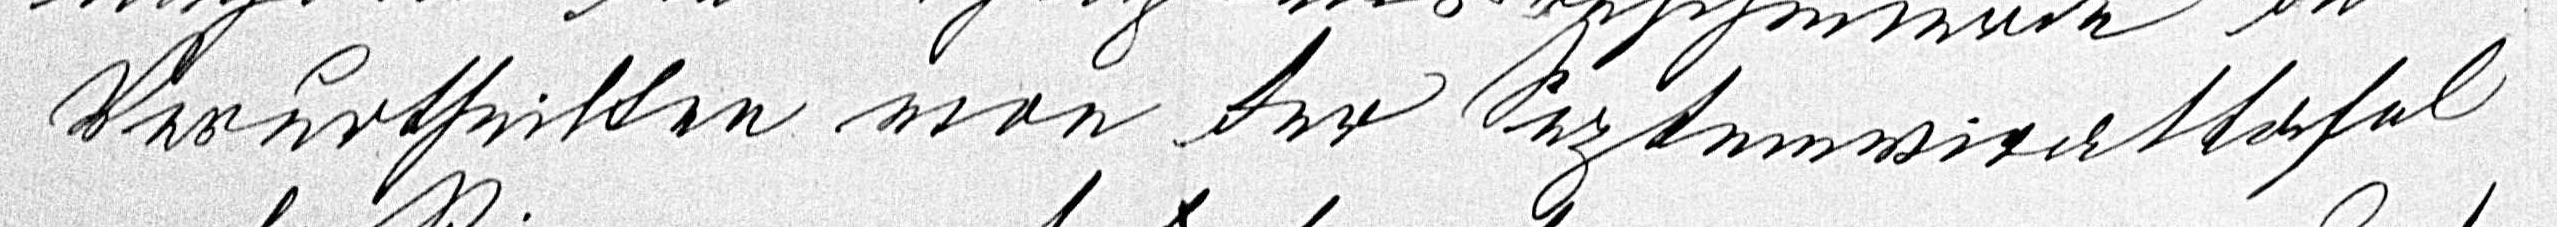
Verurtheilten von der Septemviraltafel
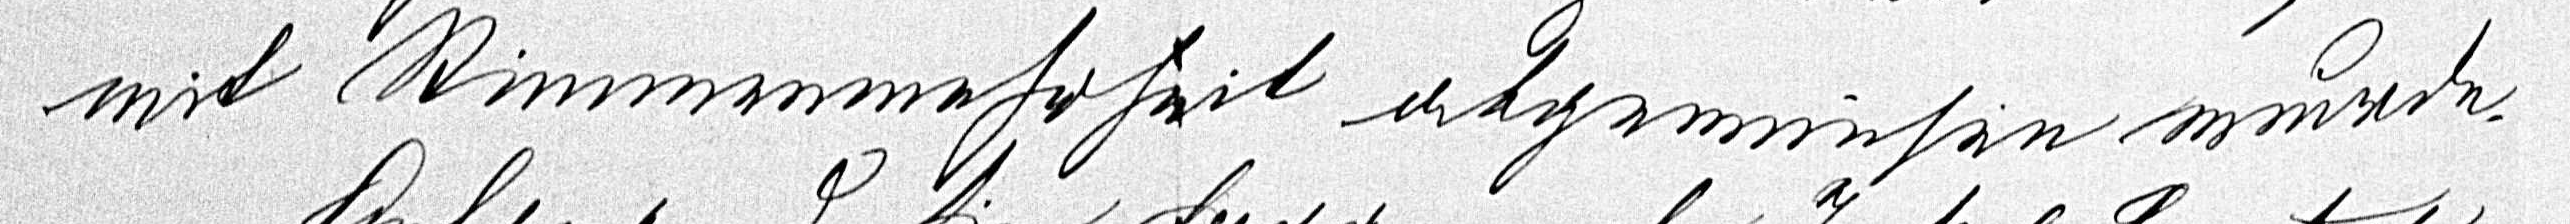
mit Simmenmehrheit abgewiesen wurde.
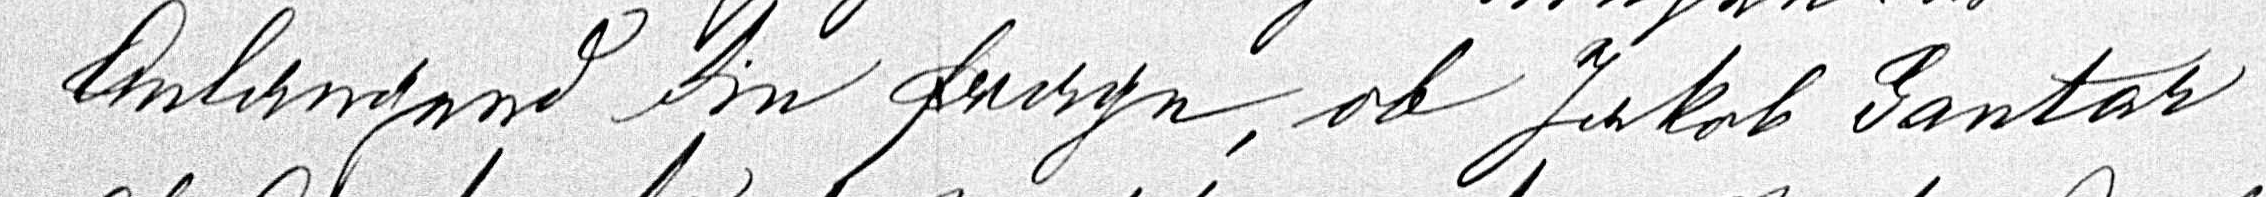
Anlangend die Frage, ob Jakob Gantar
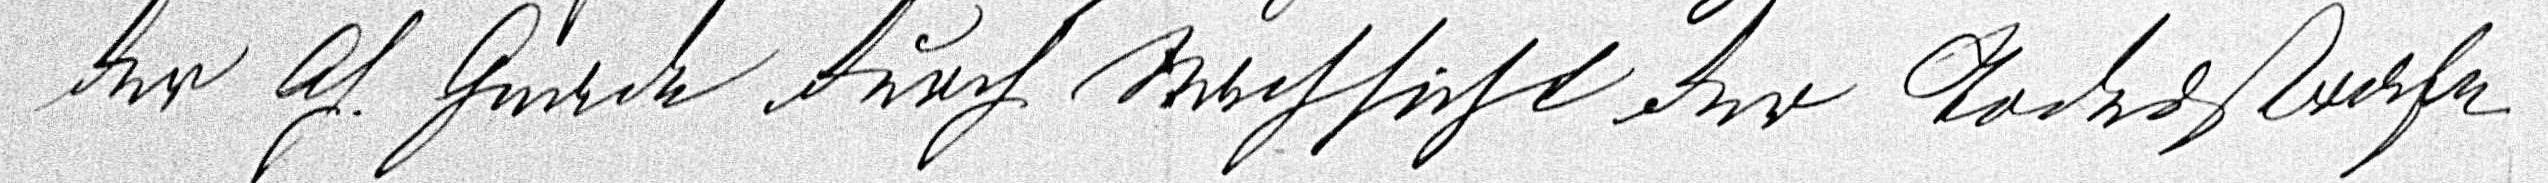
der Ah Gnade durch Nachsicht der Todesstrafe
